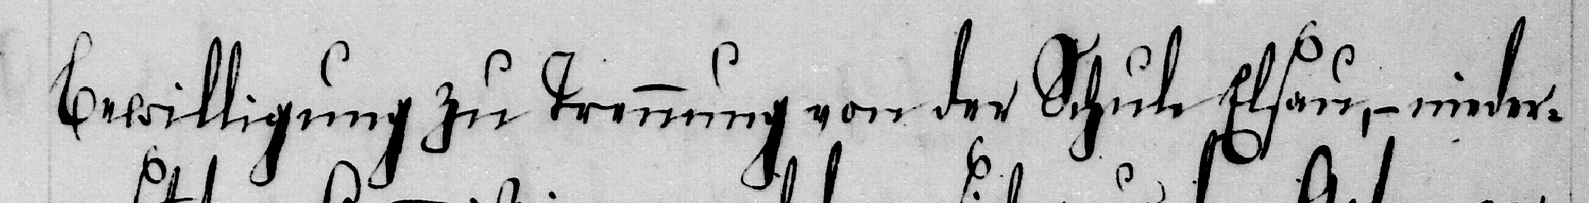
Bewilligung zu Trennung von der Schule Elsau, – nieder¬
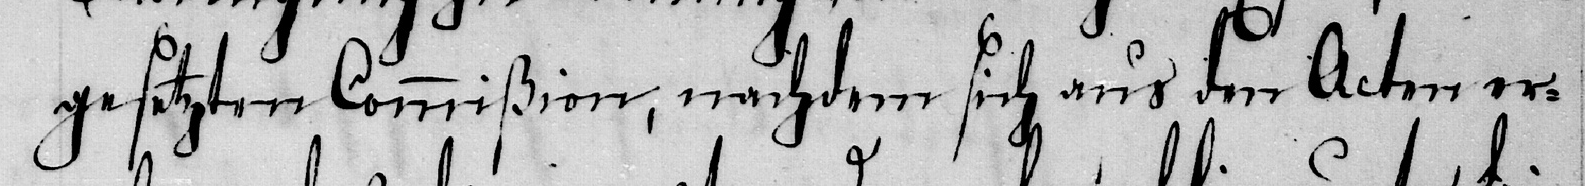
gesetzten Commißion, nachdem sich aus den Acten er¬
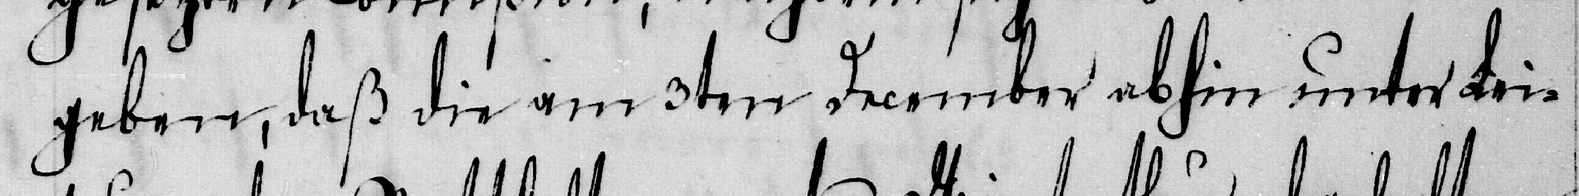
geben, daß die am 3ten December abhin unter Lei¬
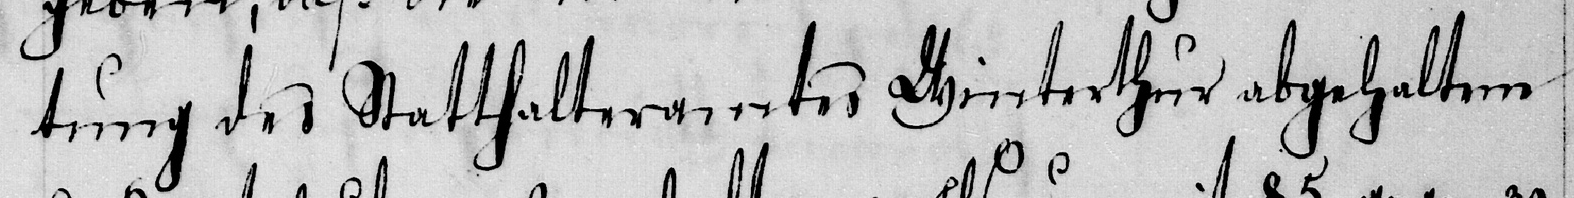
tung des Statthalteramtes Winterthur abgehaltene
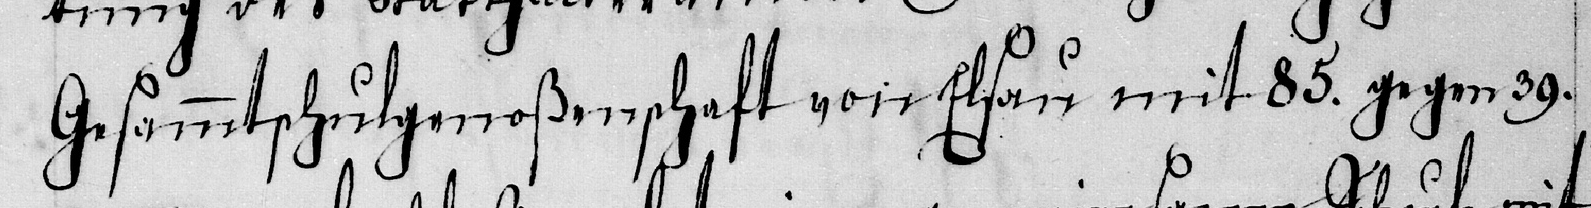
Gesammtschulgenoßenschaft von Elsau mit 85. gegen 39.
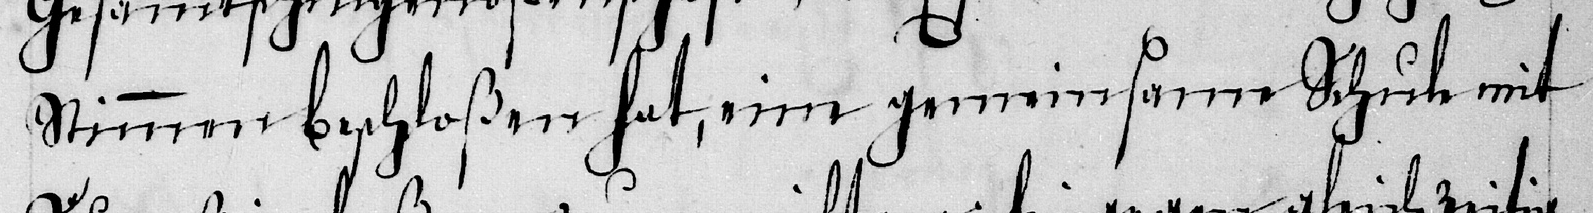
Stimmen beschloßen hat, eine gemeinsame Schule mit
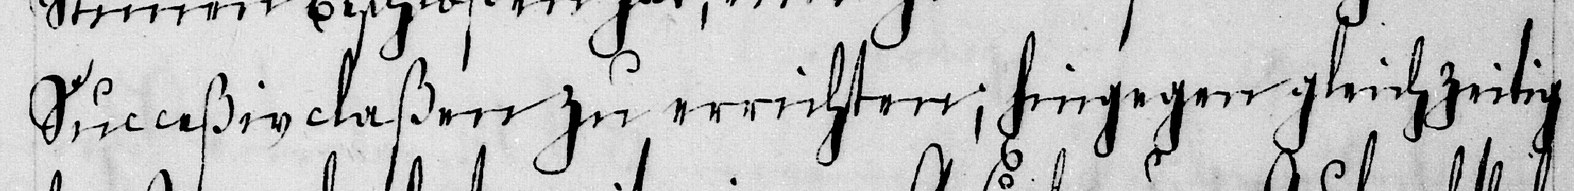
Succeßivclaßen zu errichten; hingegen gleichzeitig
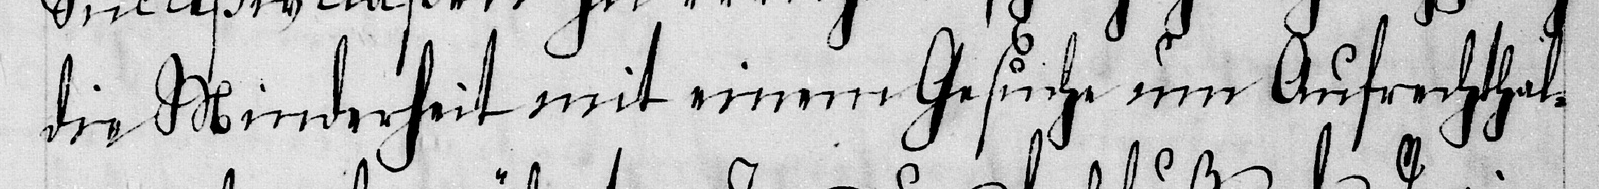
die Minderheit mit einem Gesuche um Aufrechthal¬
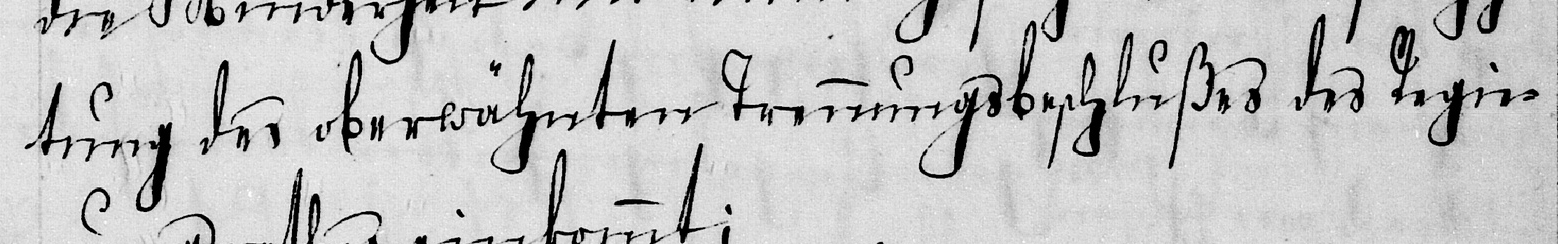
tung des oberwähnten Trennungsbeschlußes des Regie¬
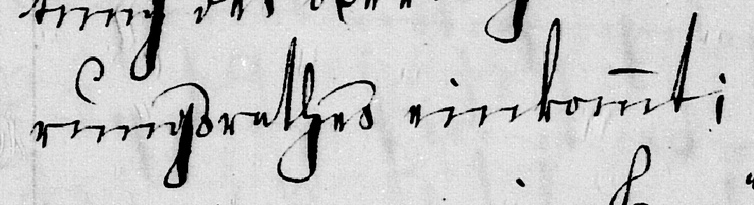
rungsrathes einkommt;
